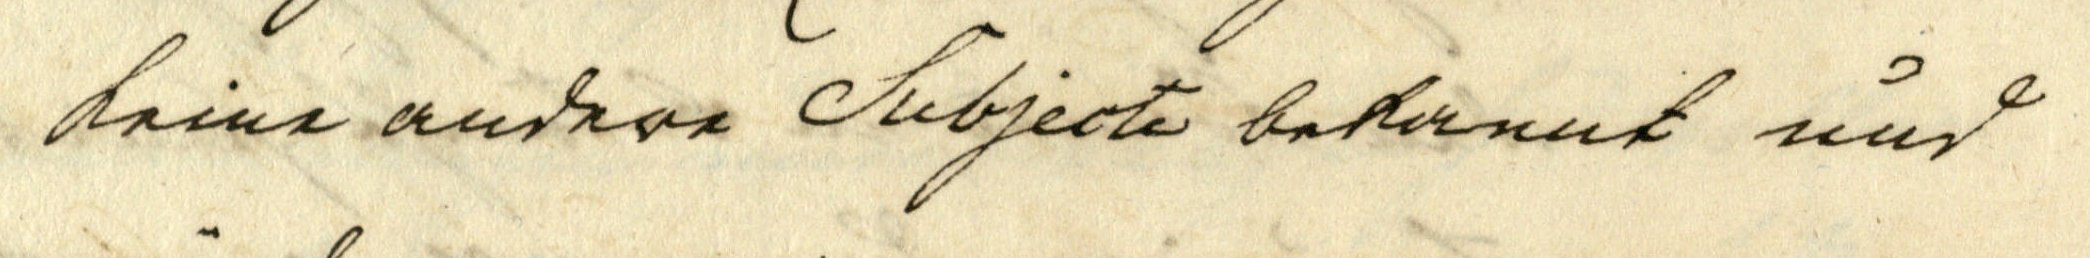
keine andere Subjecte bekannt und
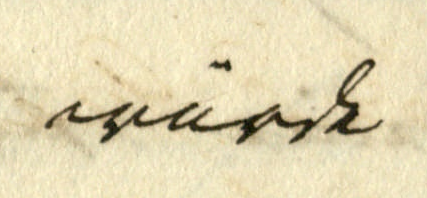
würde
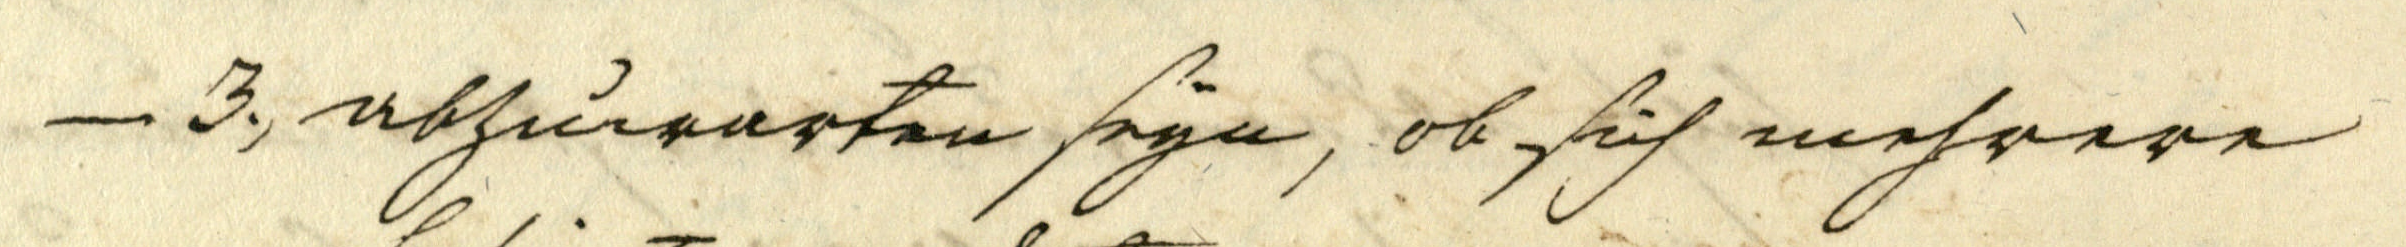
3., abzuwarten seÿn, ob sich mehrere
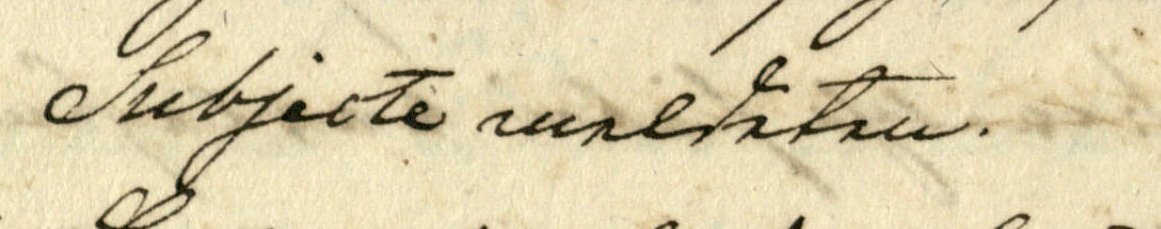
Subjecte meldeten.
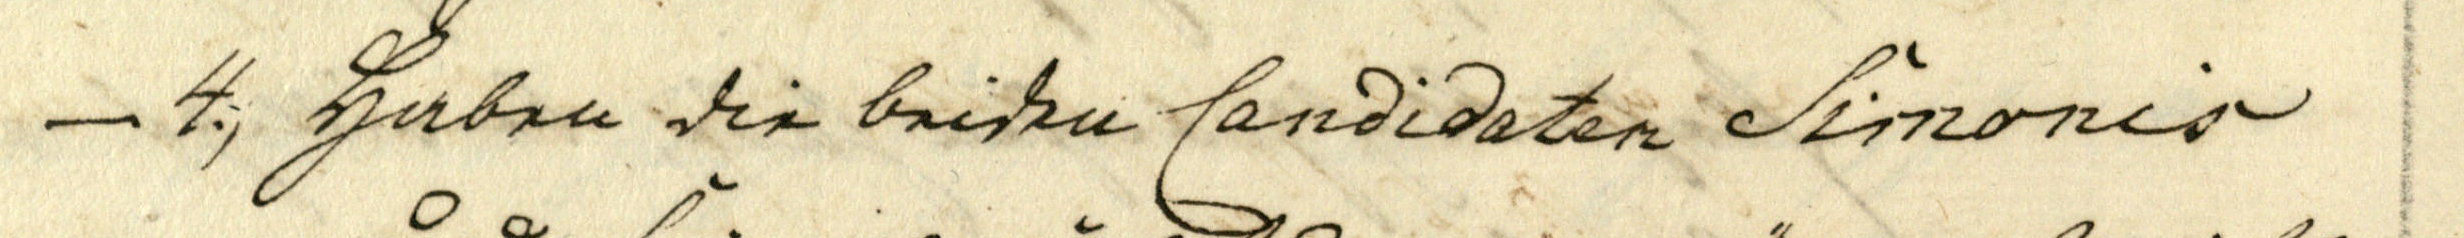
4., Haben die beiden Candidaten Simonis
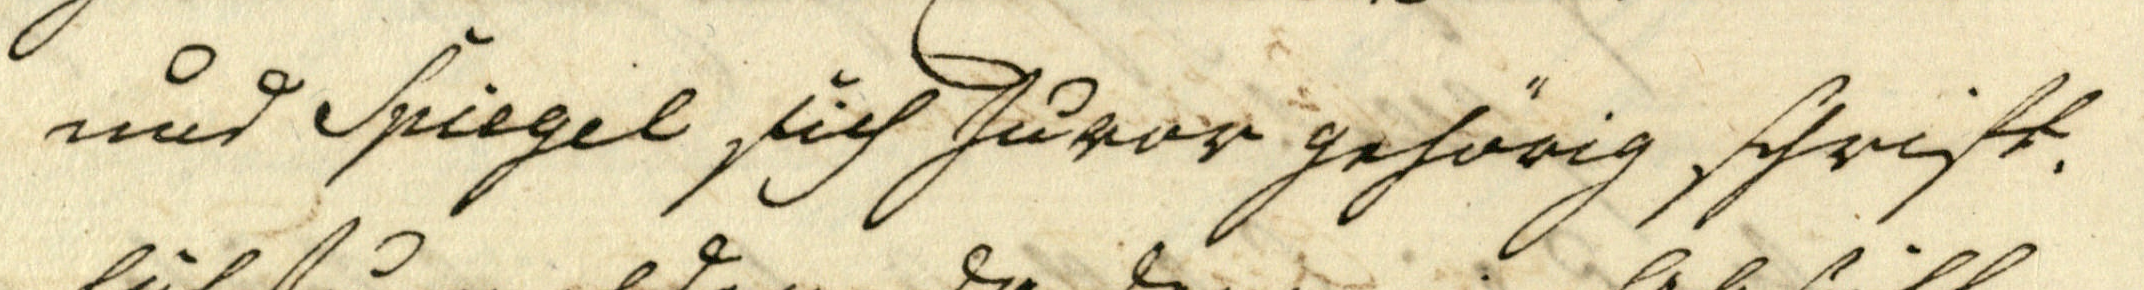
und Spiegel sich zuvor gehörig schrift¬
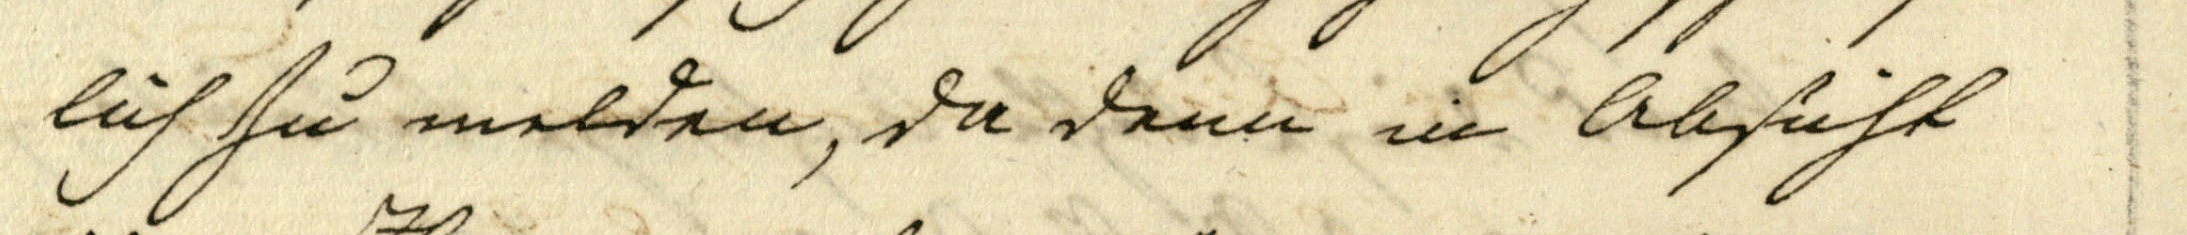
lich zu melden, da denn in Absicht
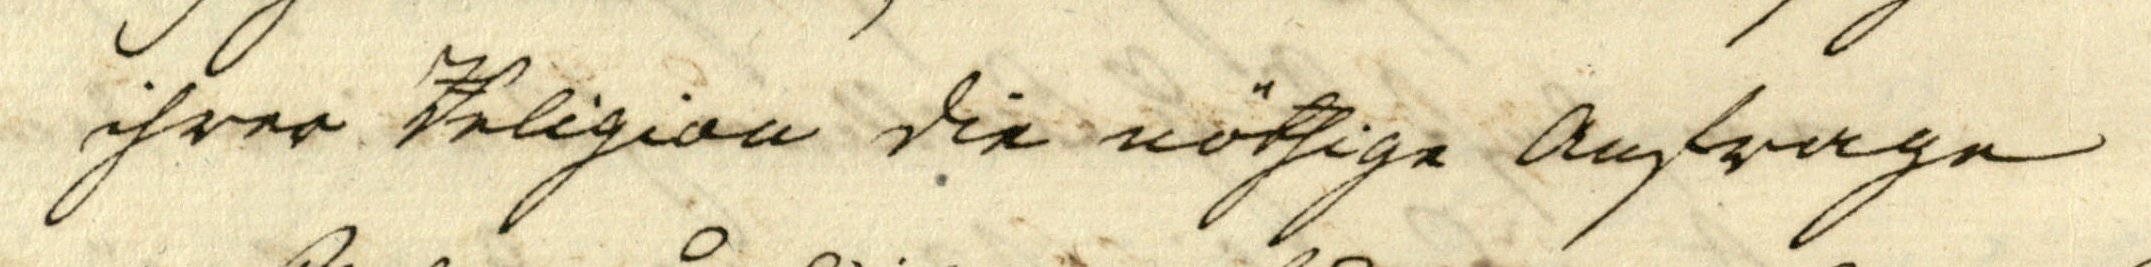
ihrer Religion die nöthige Anfrage
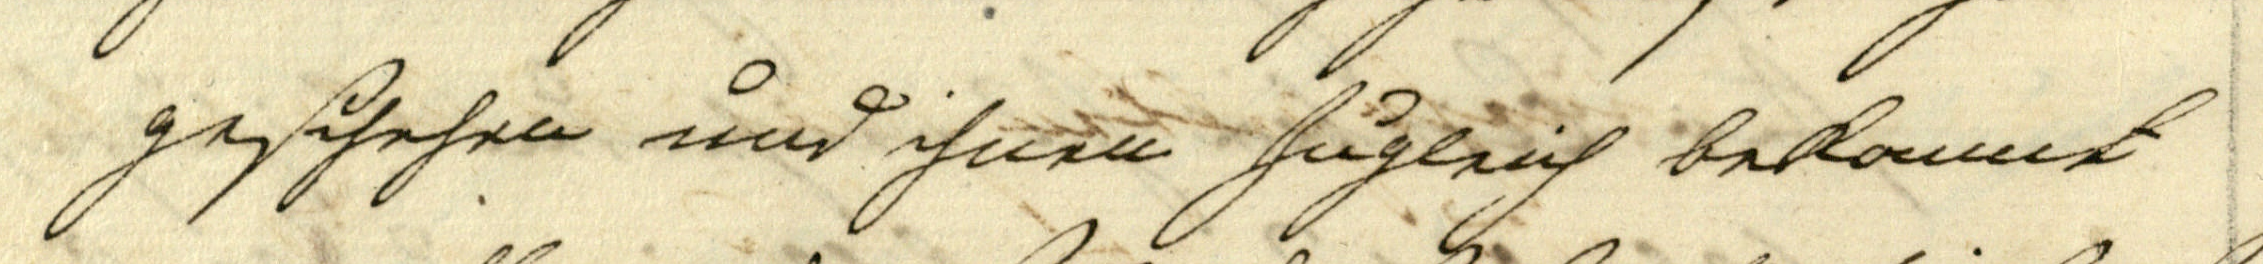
geschehen und ihnen zugleich bekannt
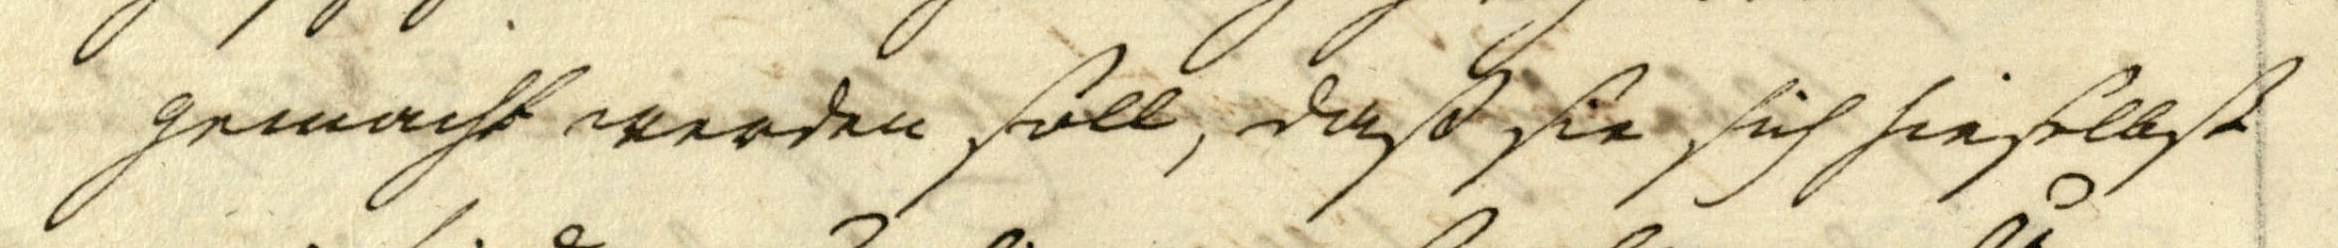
gemacht werden soll, daß sie sich hieselbst
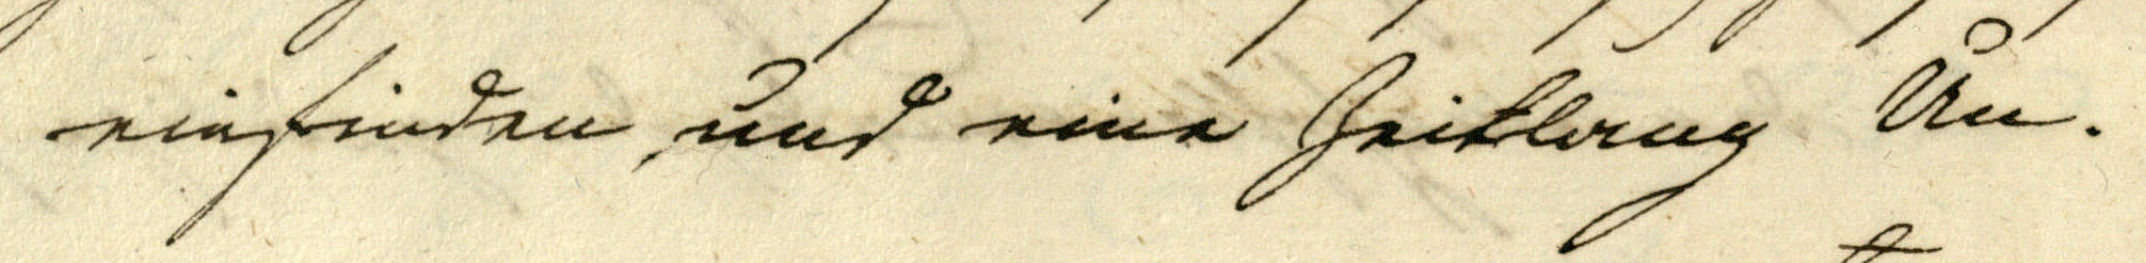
einfinden und eine Zeitlang Un¬
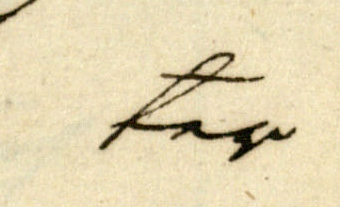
ter
